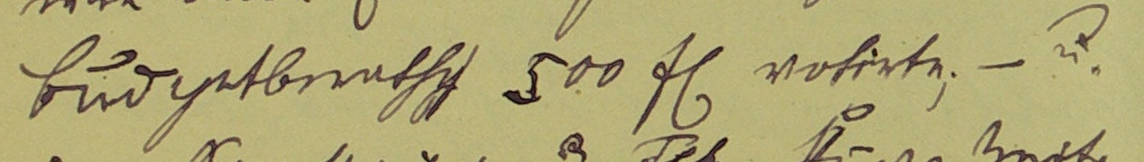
Budgetberatun 500 Fl. votierte; -und
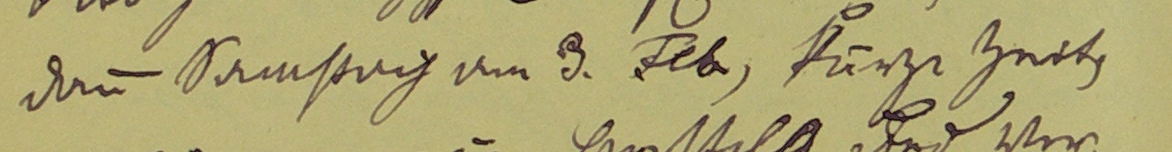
dann Samstag am 3. Febr. kurze Zeit
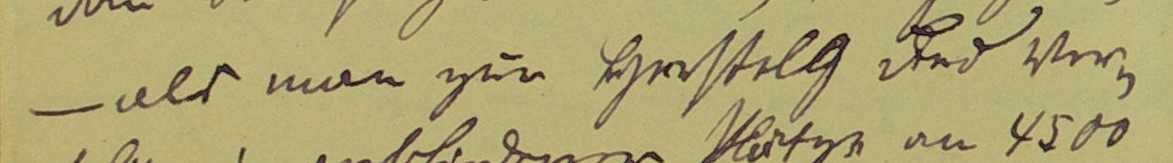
- als man zur Herstellung und Ver¬
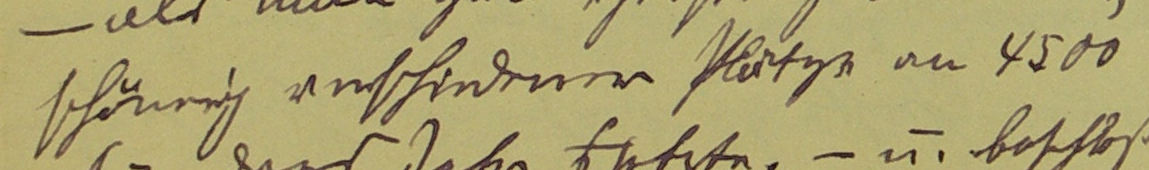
schönerung verschiedener Plätze von 4500
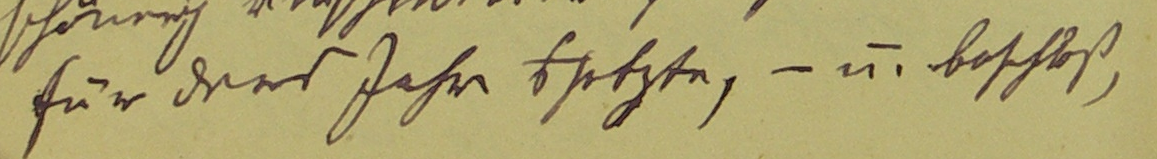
für dieses Jahr festsetzte,- und beschloß,
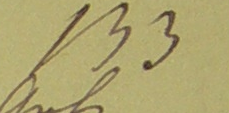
133
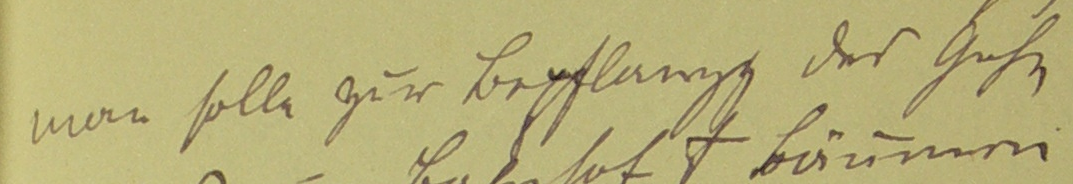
man solle zur Bepflanzung des Geh¬
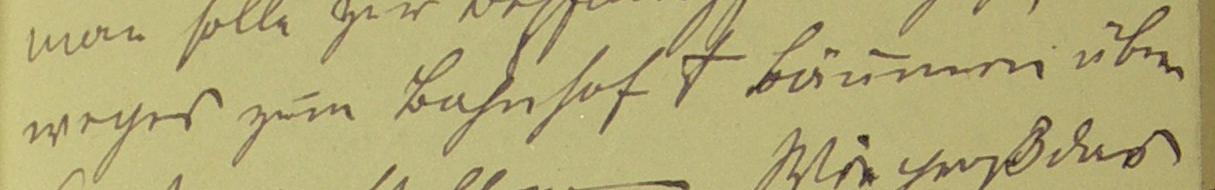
weges zum Bahnhof mit Bäumen über
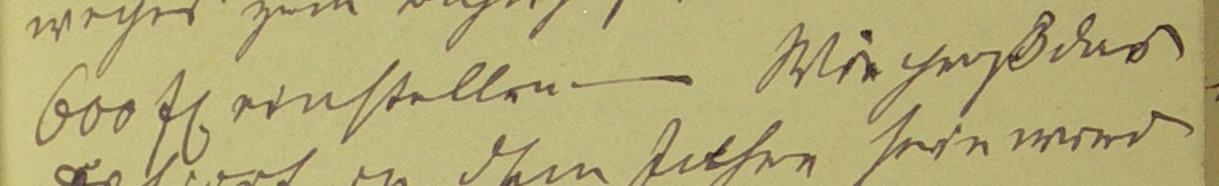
600 Fl. einstellen,-Wie groß das
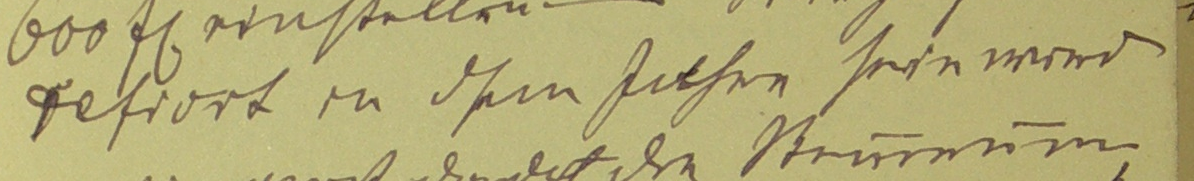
Defizit in diesem Jahre sein wird
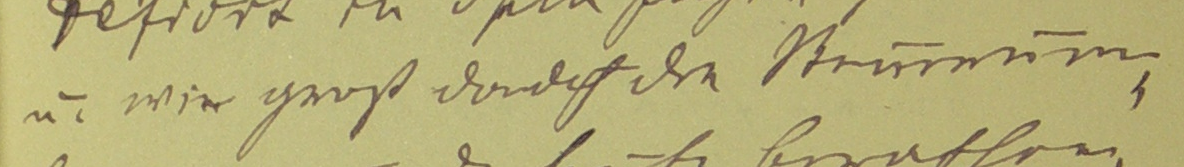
und wie groß damit die Stimmen¬
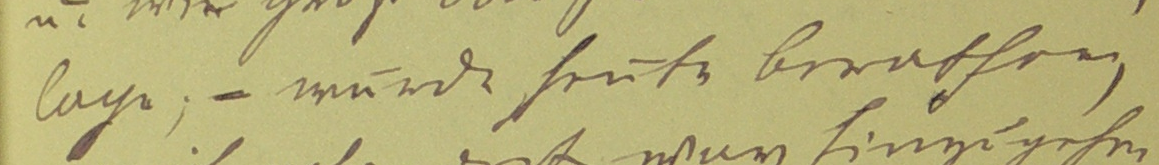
lage ;- wurde heute berathen,
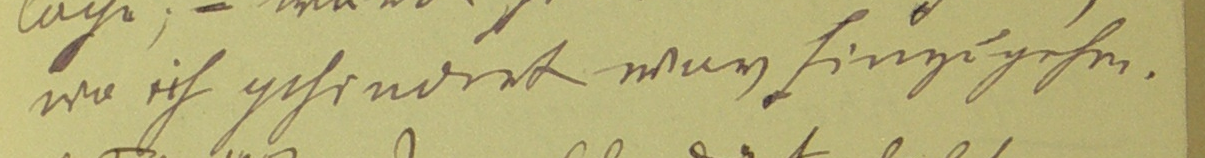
wo ich gehindert war hinzugehen.-
